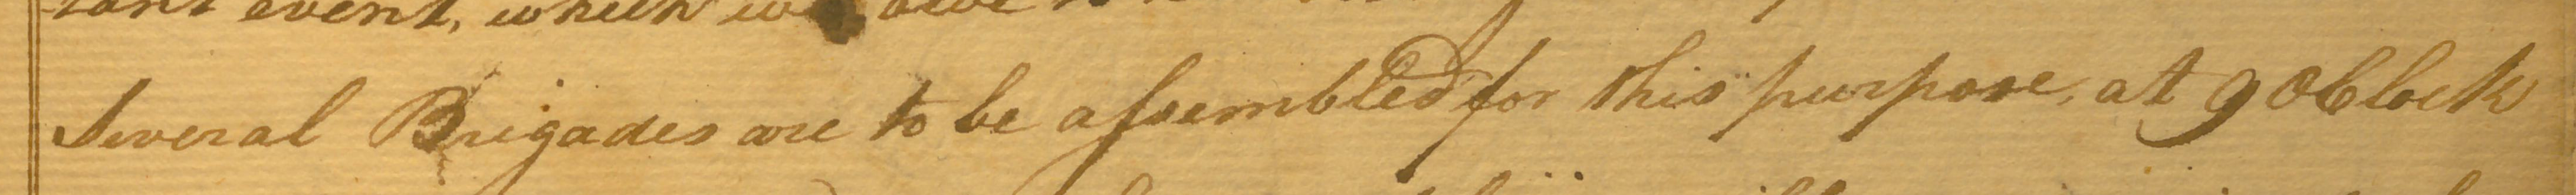Several Brigades are to be assembled for this purpose at 9 OClock
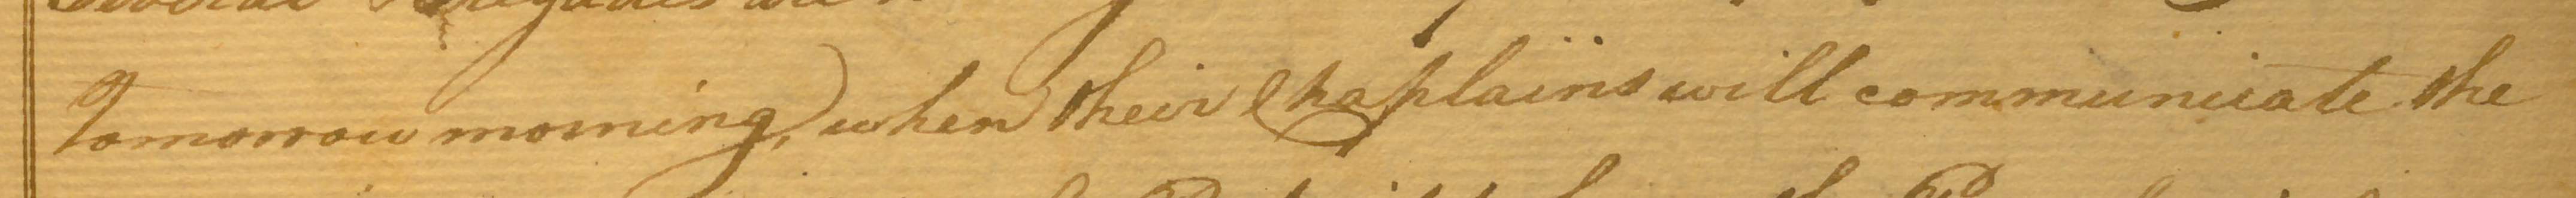tomorrow morning when their Chaplains will communicate the
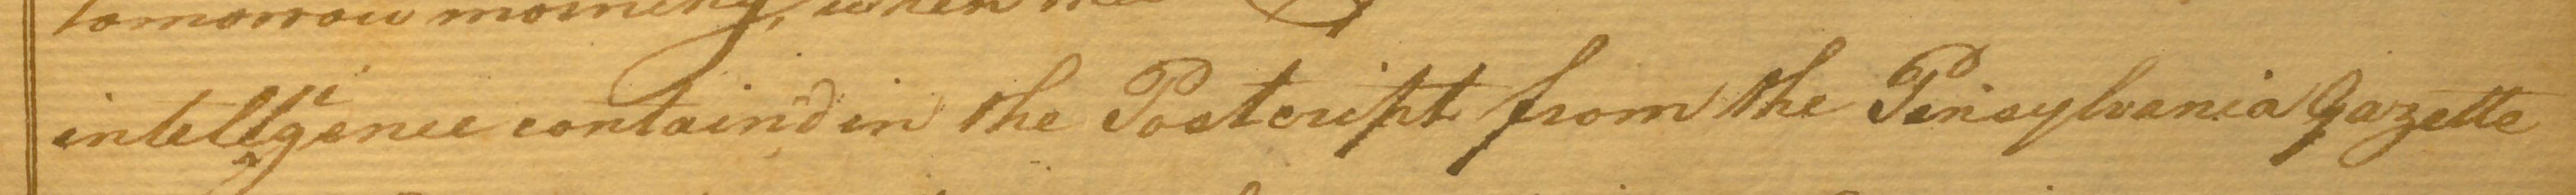intell^igence contained in the Postscript from the Pensylvania Gazette
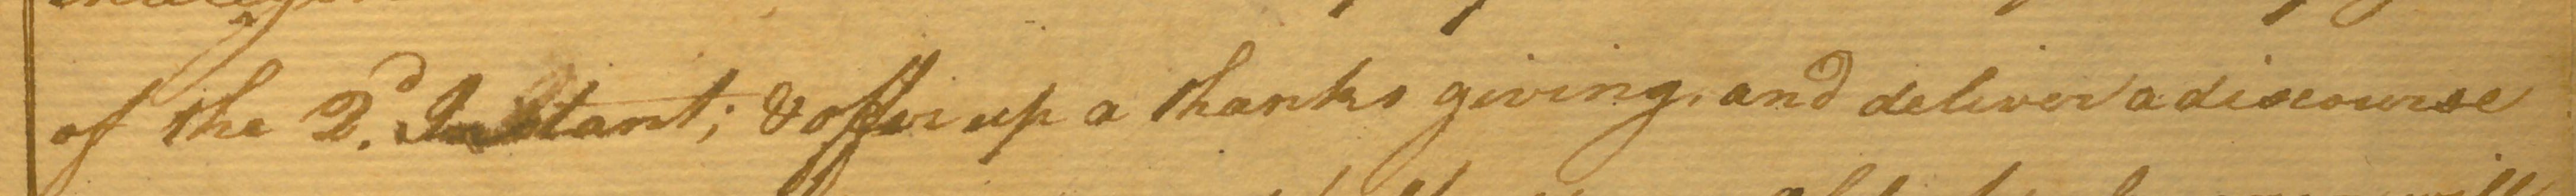of the 2^d. Instant; & offer up a thanksgiving and deliver a discourse
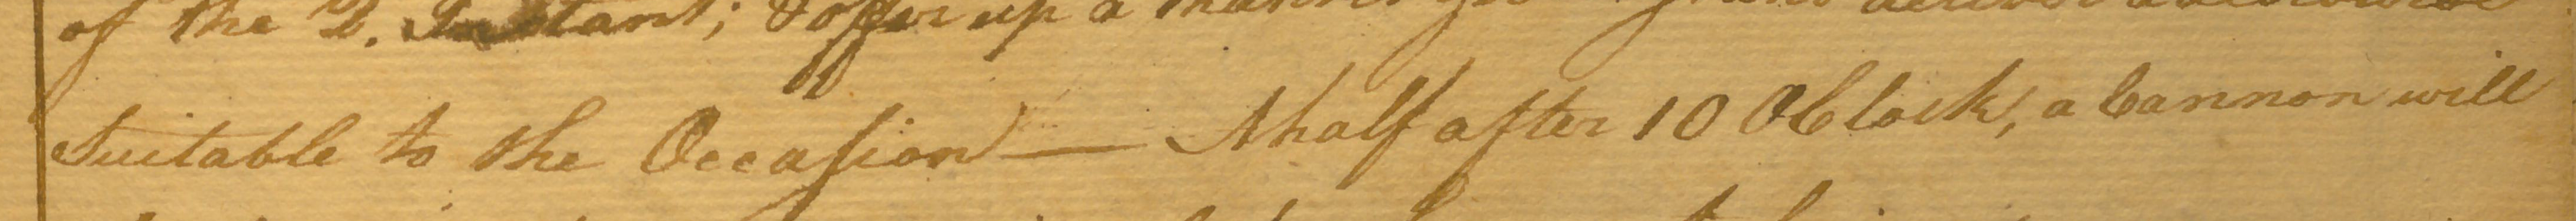Suitable to the Occasion- A half after 10 oClock, a Cannon will
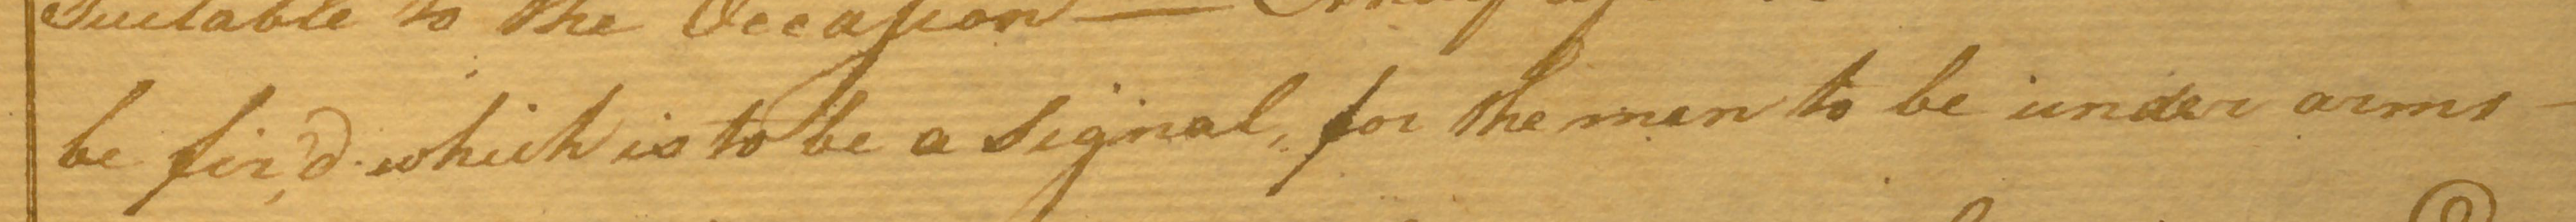be fir'd which is to be a signal for the men to be under arms
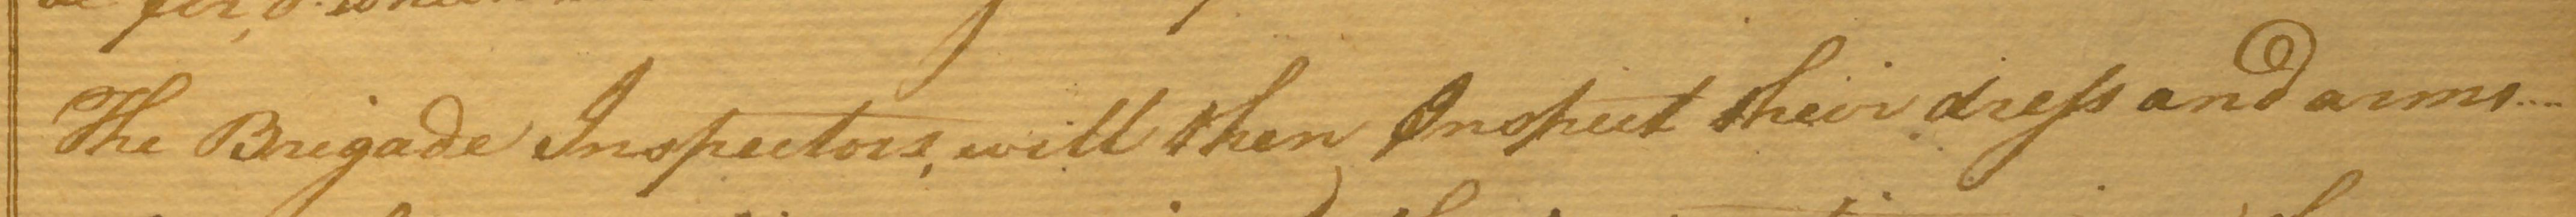The Brigade Inspectors will then Inspect their dress and arms.
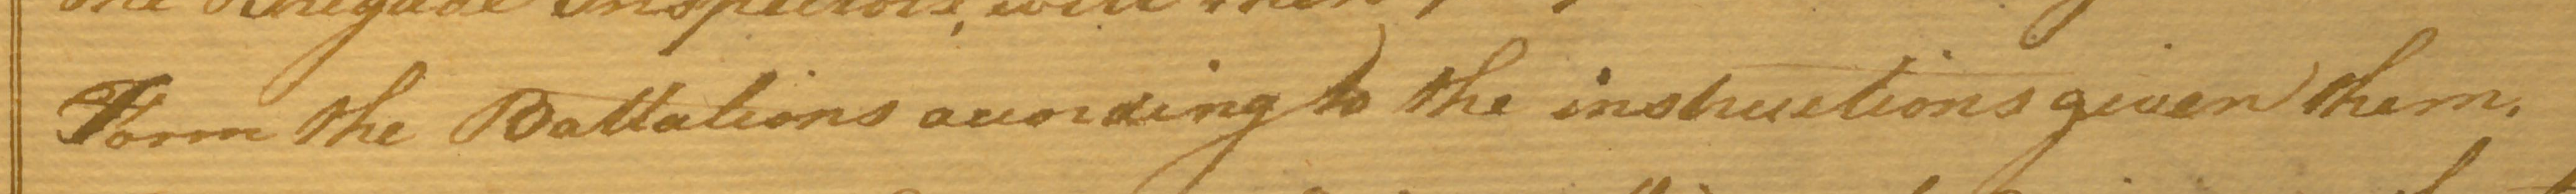Form the Battalions according to the instructions given them
